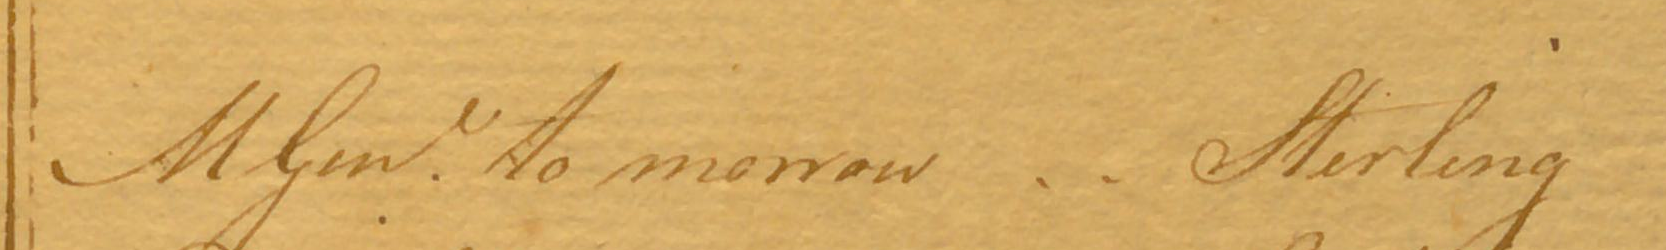MGen^l. to morrow.. Sterling
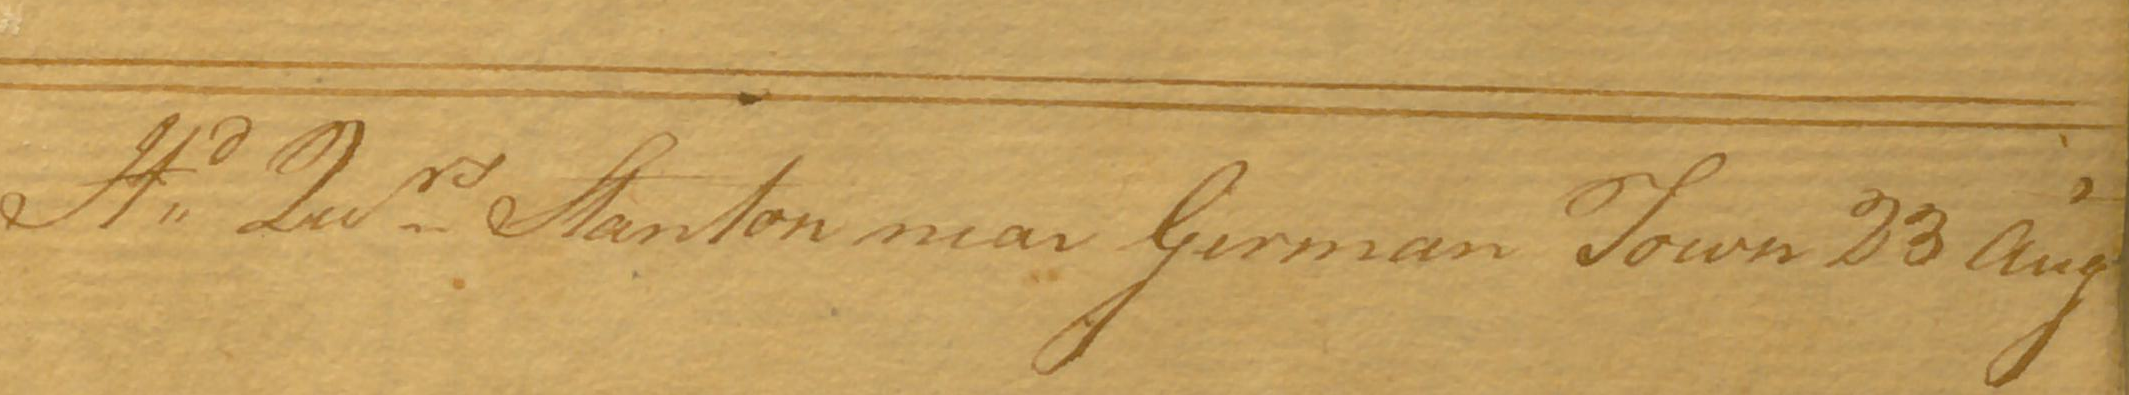H^d. Qu^rs. Stanton near German Town 23 Aug
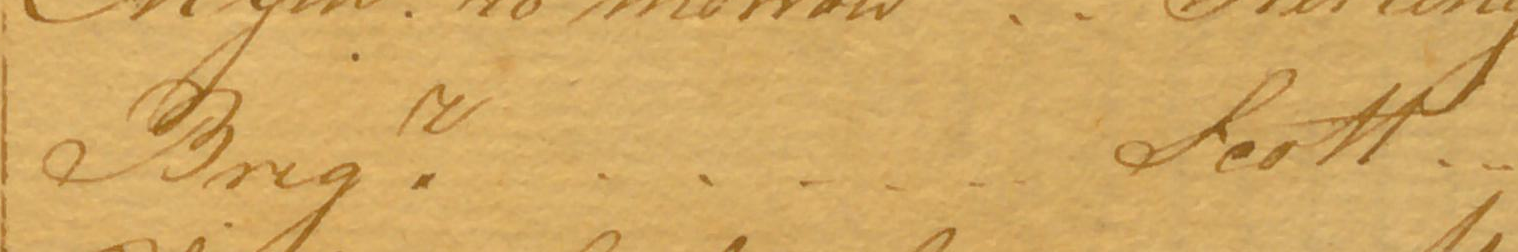Brig^r. ...... Scott.
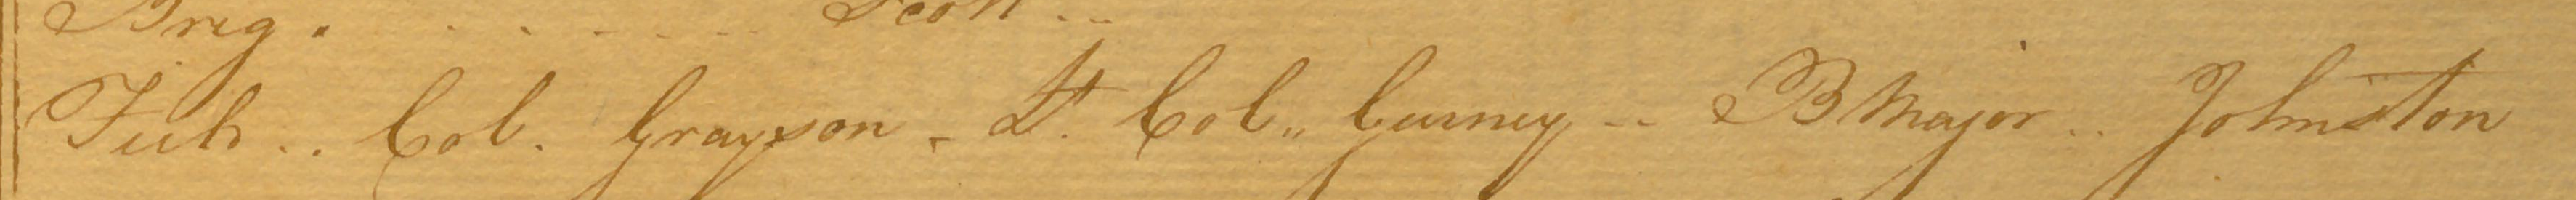Field.. Col. Grayson. L^t. Col. Gurney.. B Major.. Johnston
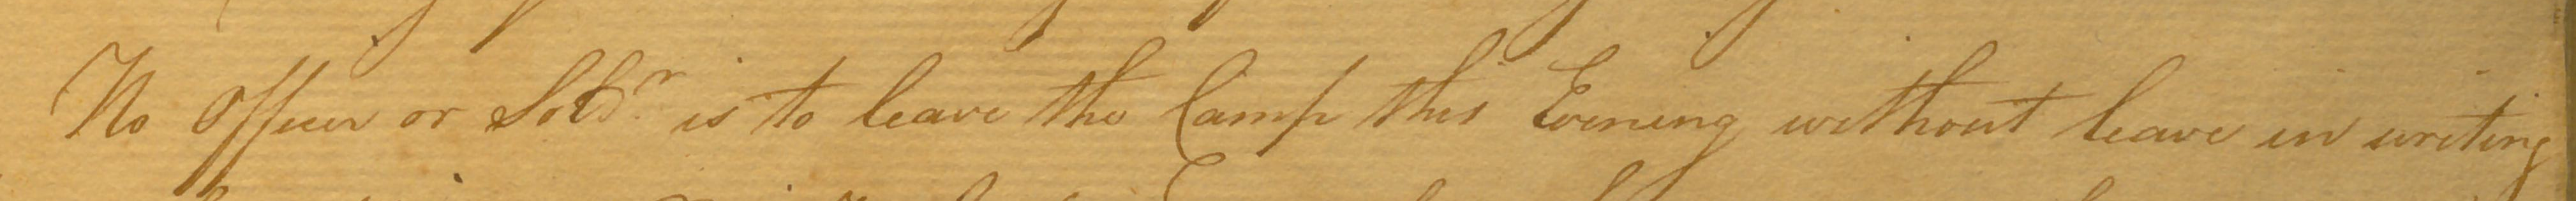No Officer or Sold^r. is to leave the Camp this Evening without leave in writing
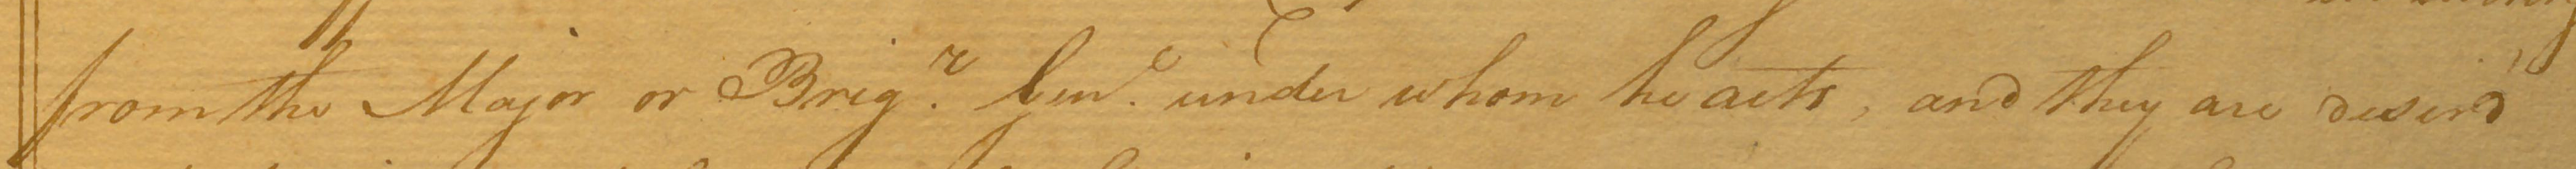from the Major or Brig^r. Gen^l. under whom he acts, and they are desir'd
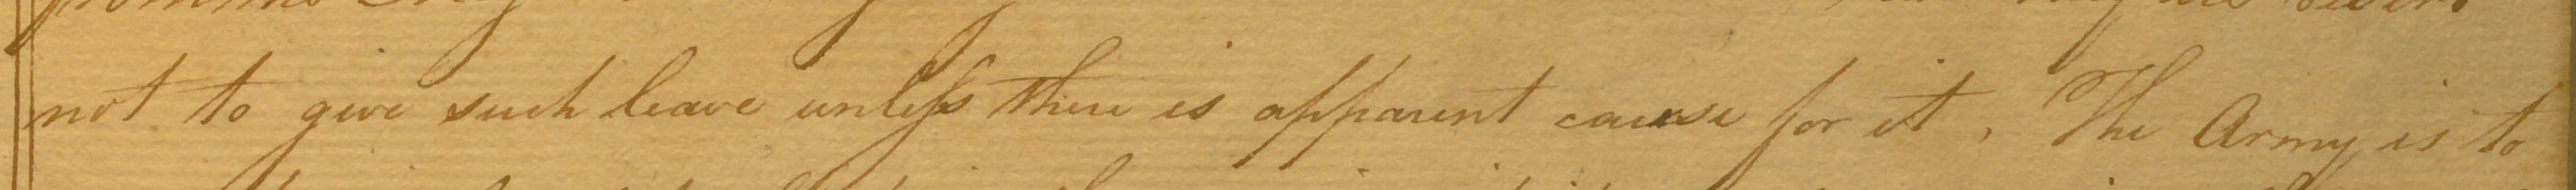not to give such leave unless there is apparent cause for it. They Army is to
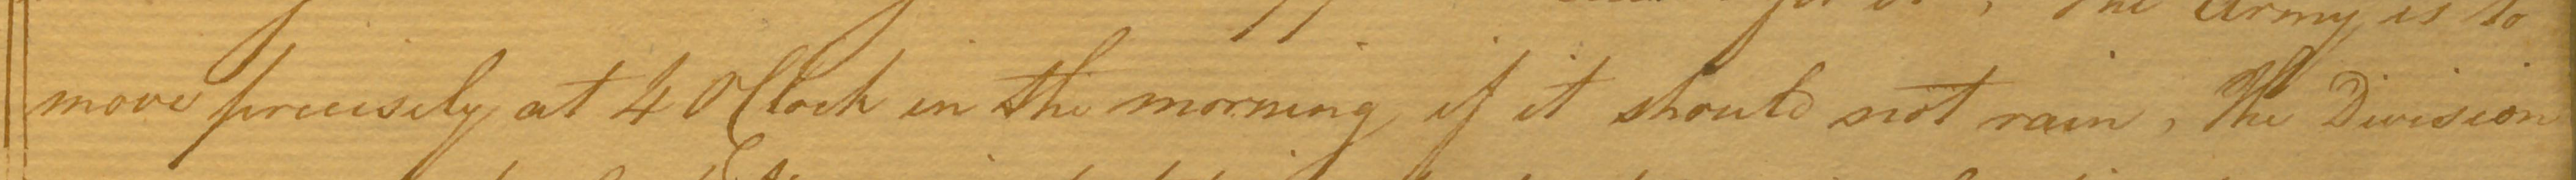move precisely at 4 oClock in the morning, if it should not rain, The Division
